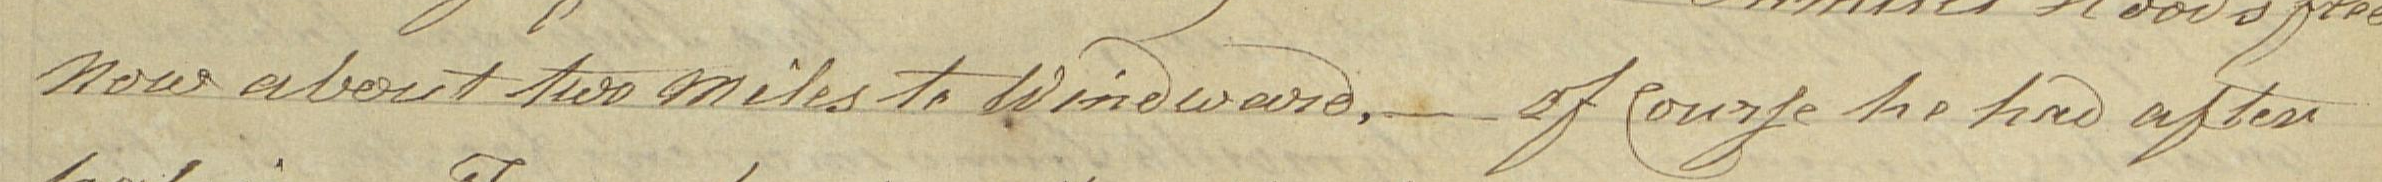now about two miles to Windward, of Course he had after
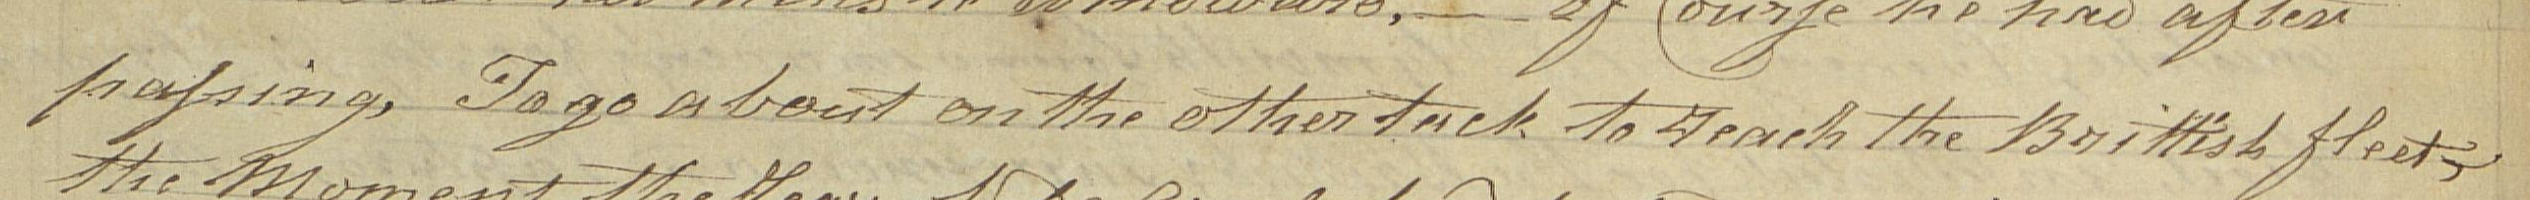passing, To go about on the other tack to reach the Brittish fleet,
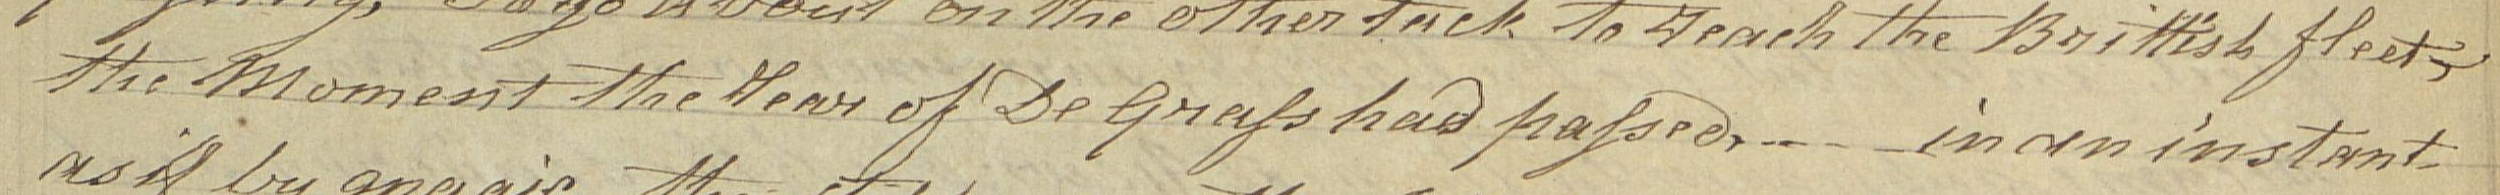the moment the Rear of De Grass had passed, in an instant
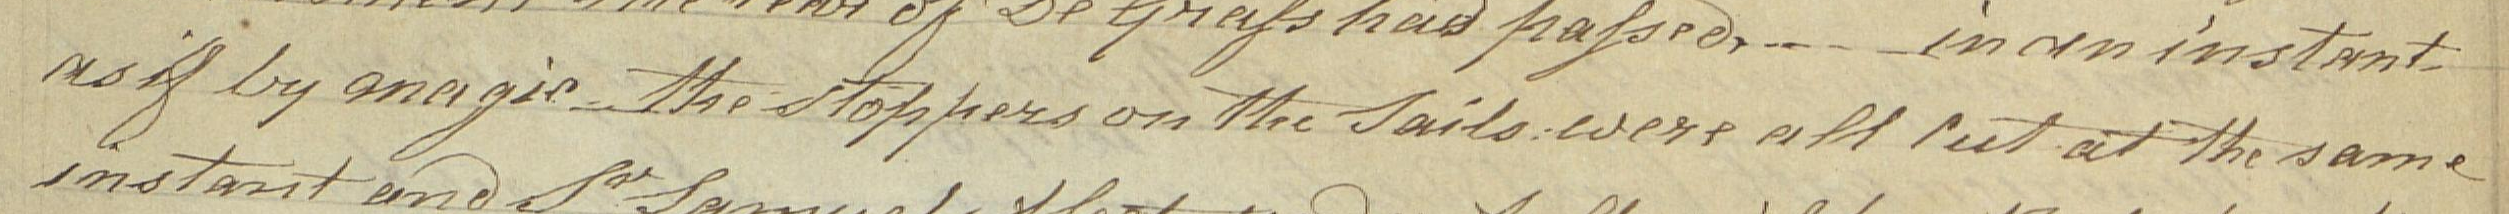as if by magic the stoppers on the sails were all cut at the same
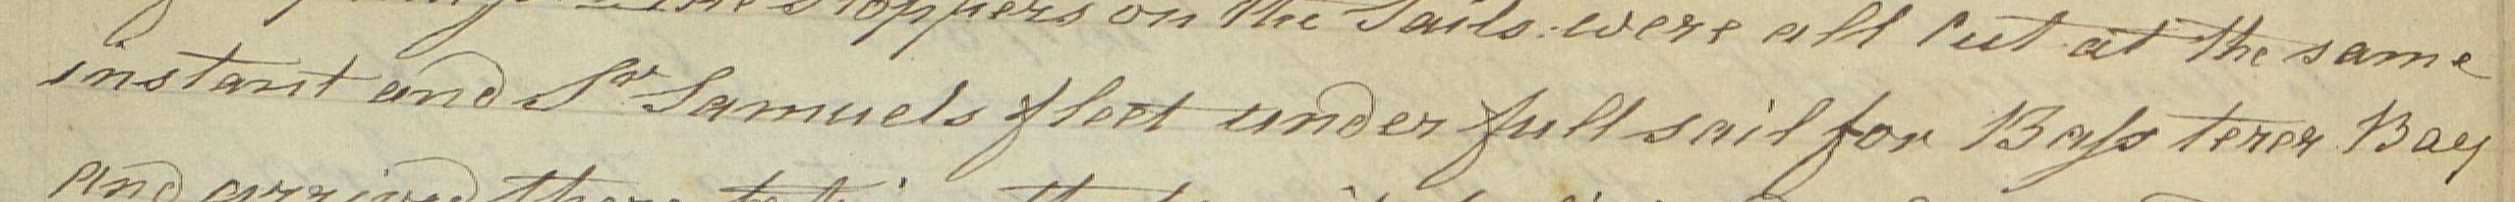instant and S^r Samuels fleet under full sail for Bassterre Bay
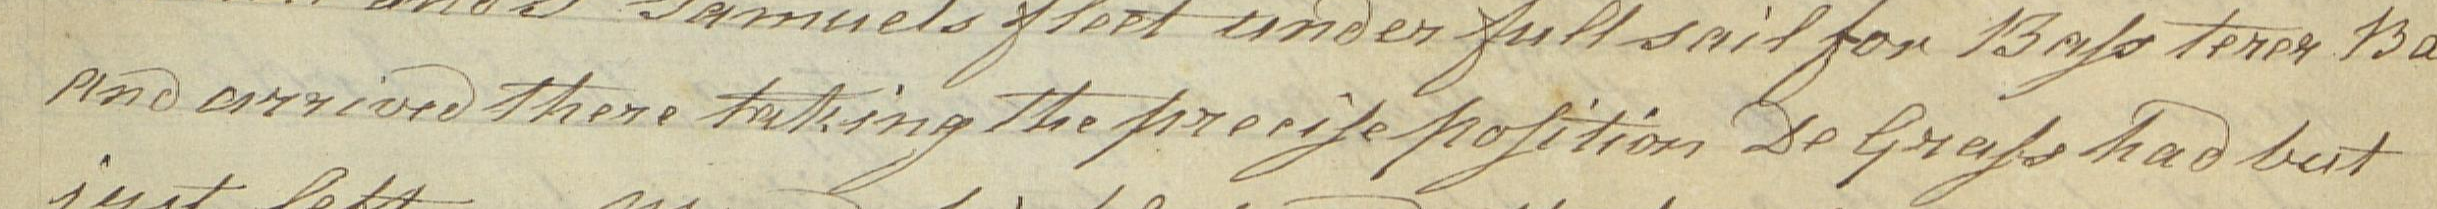and arrived there taking the precise position De Grass had but
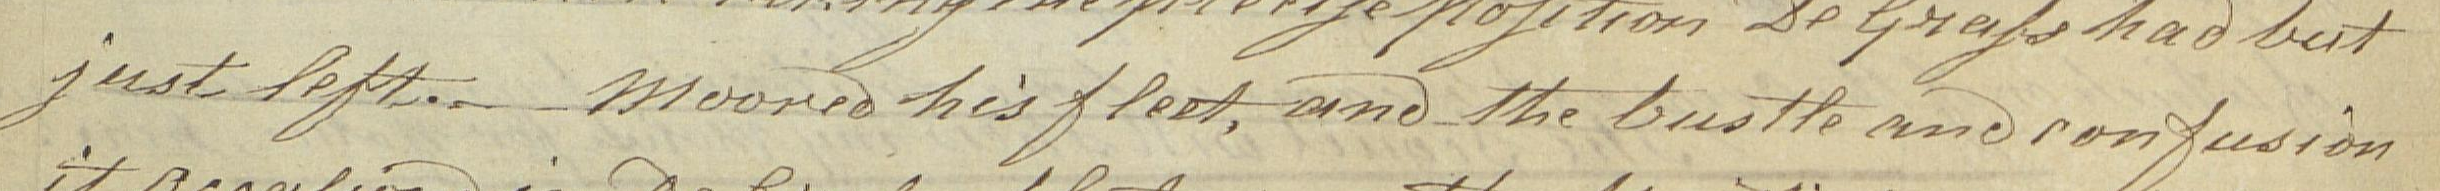just left. Moored his fleet, and the bustle and confusion
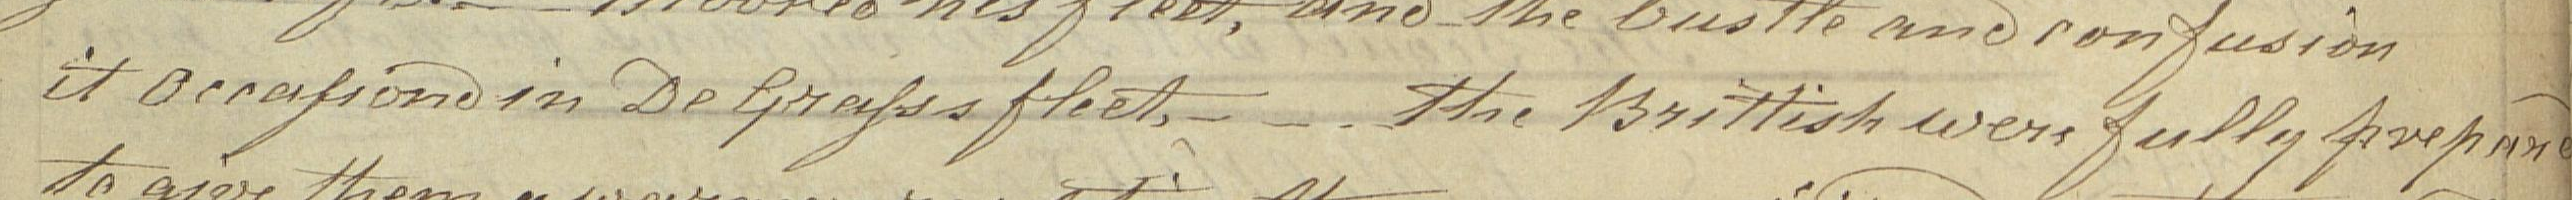it occasiond in De Grasss fleet, the Brittish were fully prepard
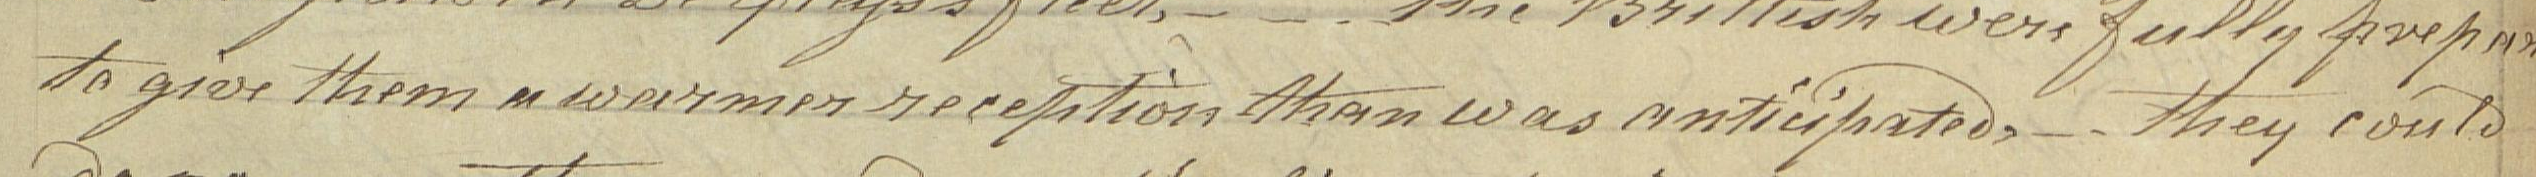to give them a warmer reception than was anticipated, they could
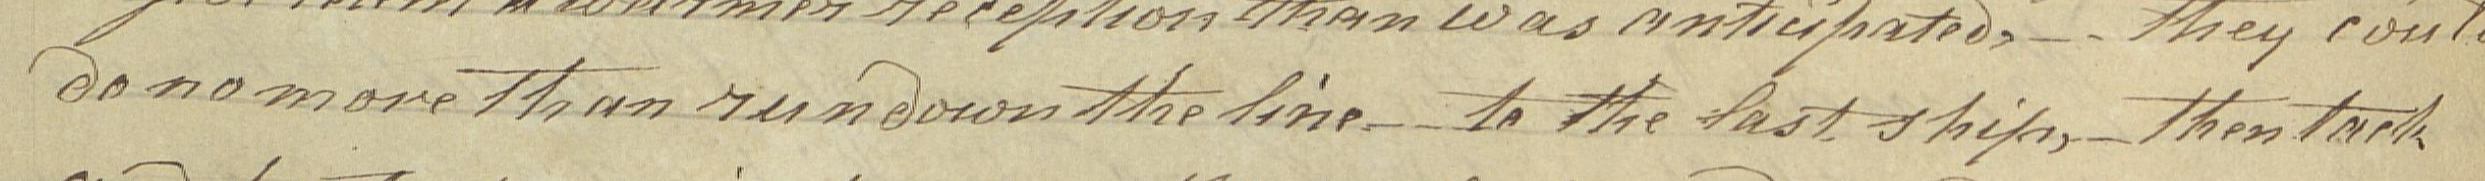do no more than run down the line to the last ship, then tack
